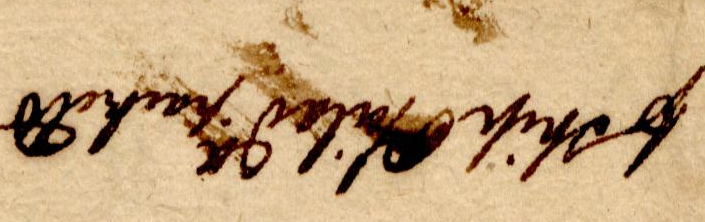per Ship Philad^a. packett
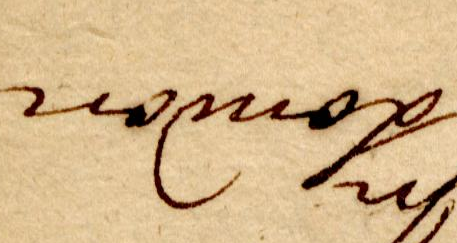London
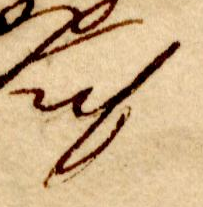In
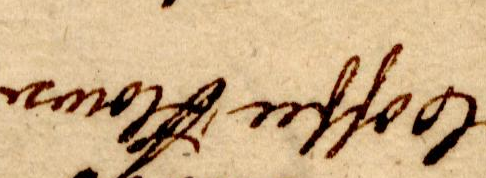Coffee House
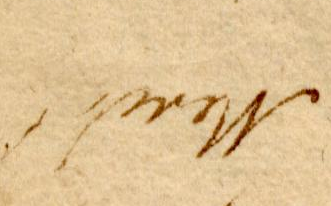Merch^t
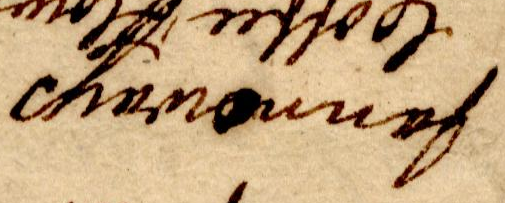Jannoways
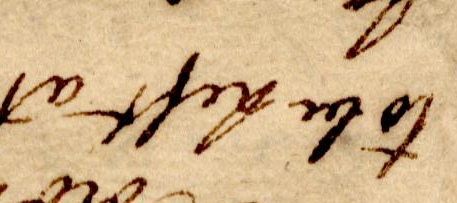to be Left at
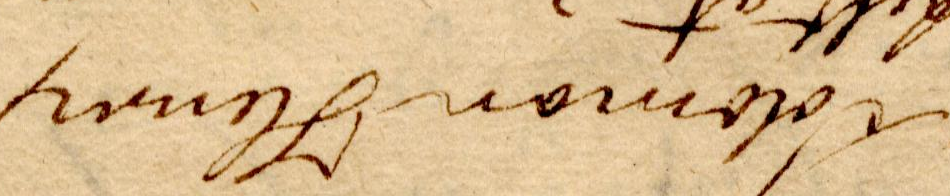Solomon Henry
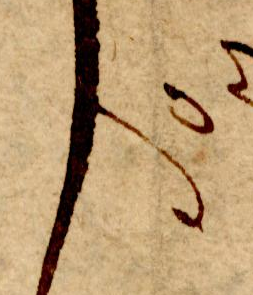To
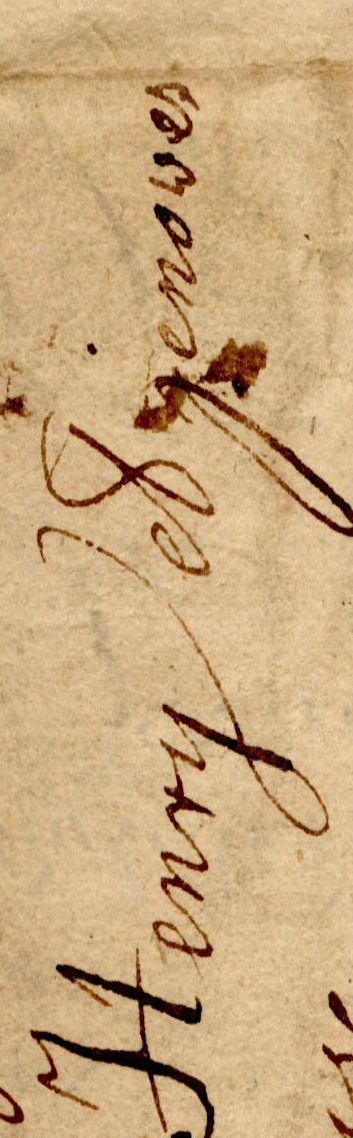Henry et jenowes
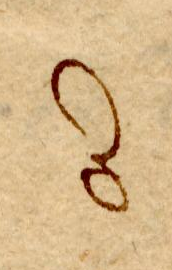@
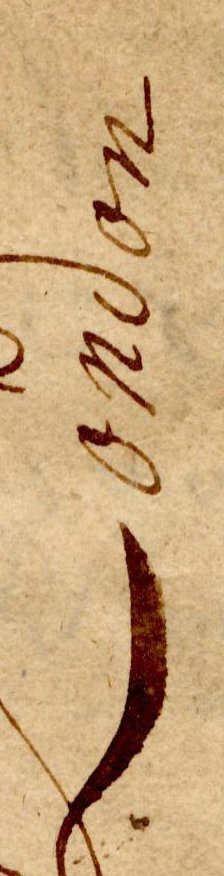London
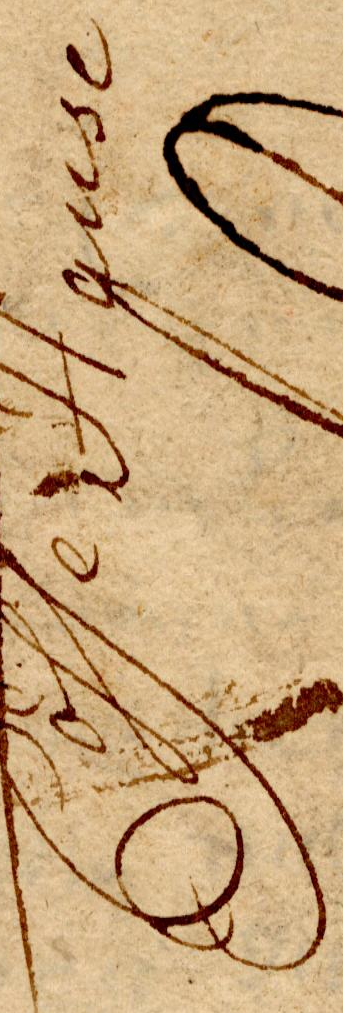Coffee House
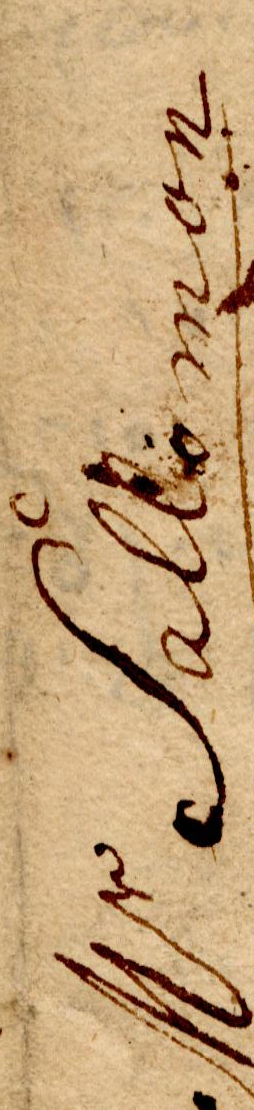M^r Sallomon
